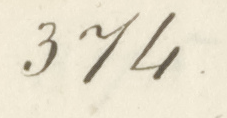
374
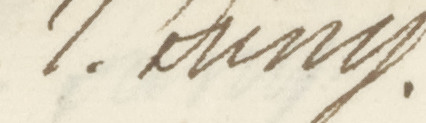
7. Junij.
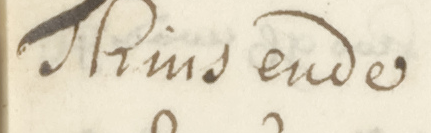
Thins ende
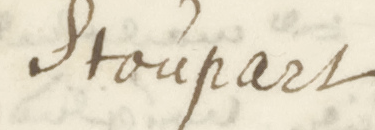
Stoupart
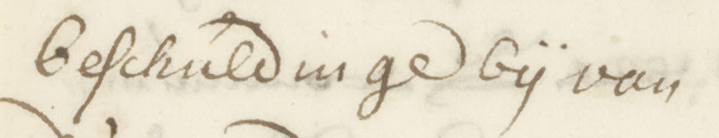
beschuldinge bij van
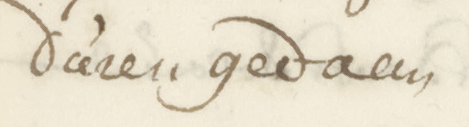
duren gedaen
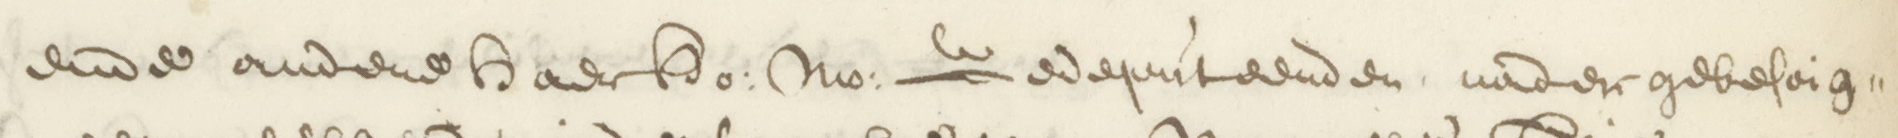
ende andere haer Ho:Mo: Gedeputeerden nader gebesoig„
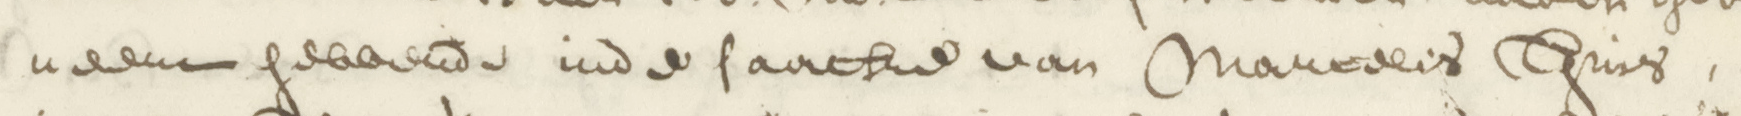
neert hebbende inde saecke van Marcelis Thins
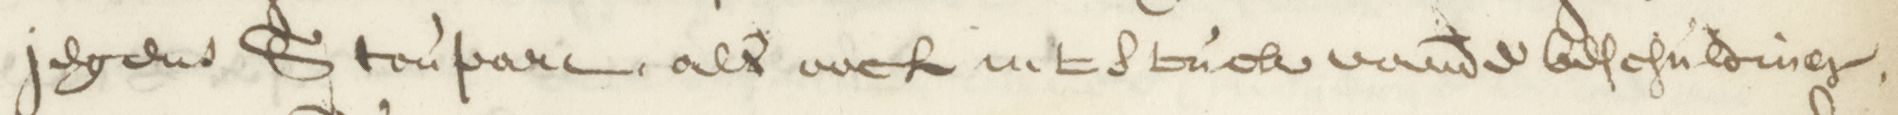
jegens Stoupart als oock in 't stuck vande beschulding
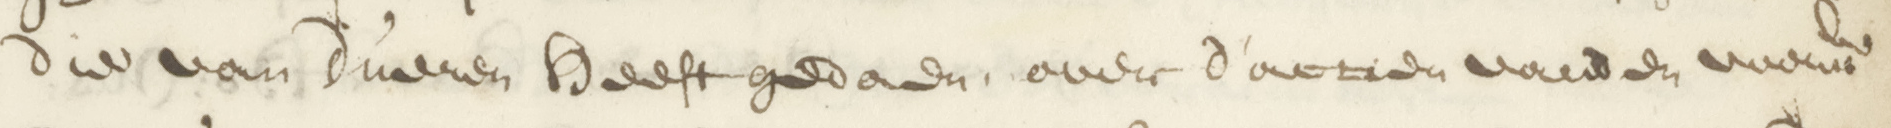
die van dueren heeft gedaen, over d'actien vanden voorn
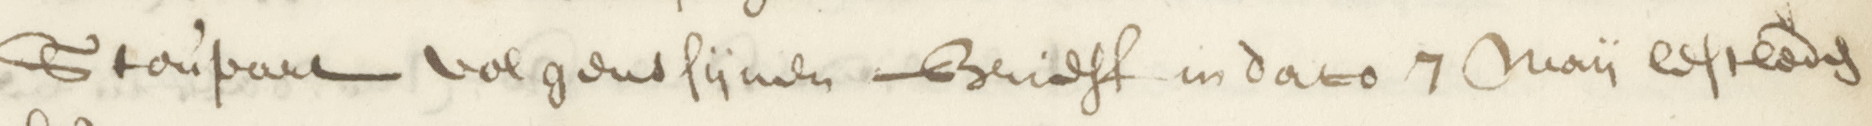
Stoupart volgens sijnen brieff in dato 7 Maij lestleden.
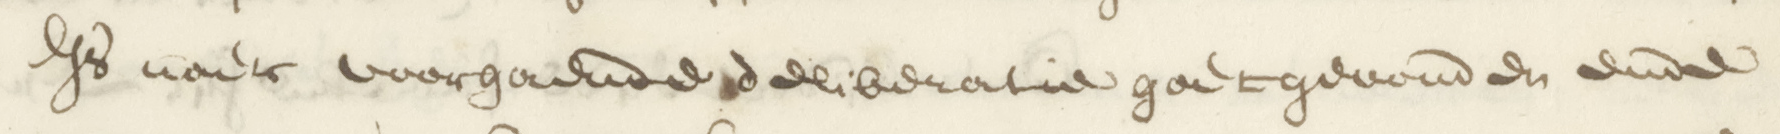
Is naer voorgaende deliberatie goetgevonden ende
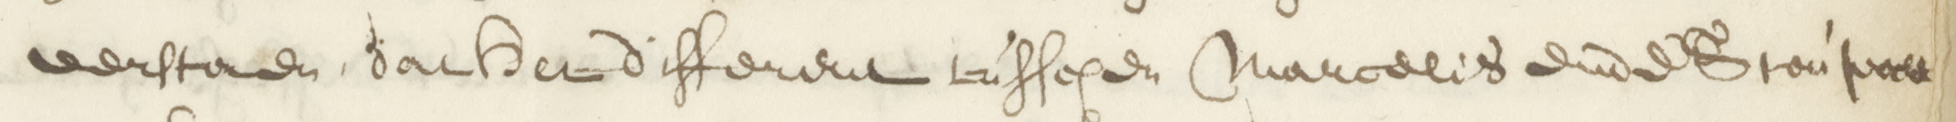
verstaen, dat het different tusschen Marcelis ende Stoupart
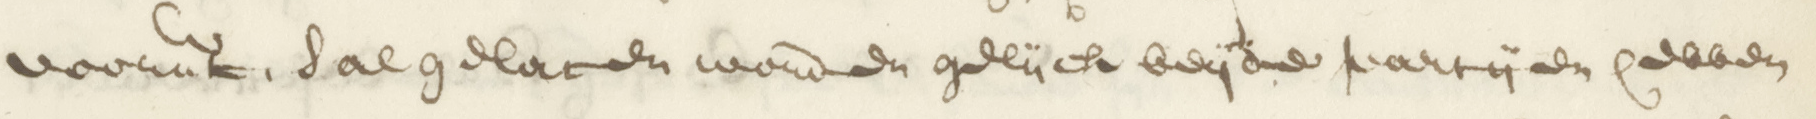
voornt sal gelaten worden gelijck beijde partijen hebben
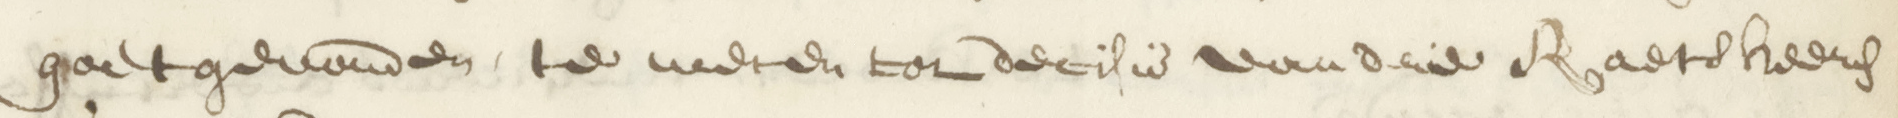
goetgevonden, te weten tot decisie vandie Raetsheeren
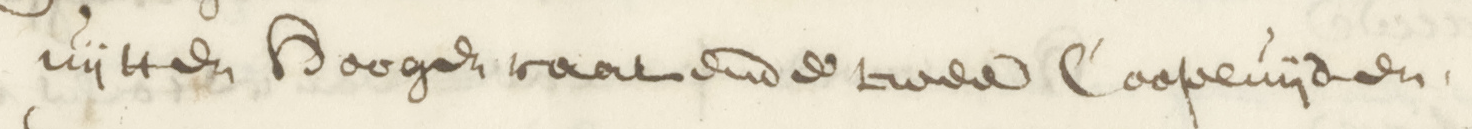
uijtten Hoogen raat ende twee Coopluijden.
